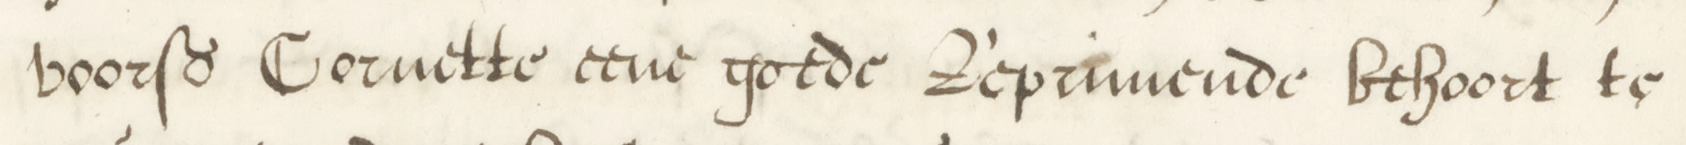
voors Cornette eene goede Reprimende behoort te
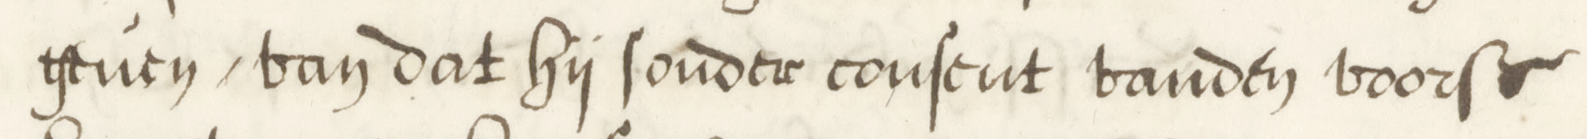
geuen, van dat hij sonder consent vanden voors
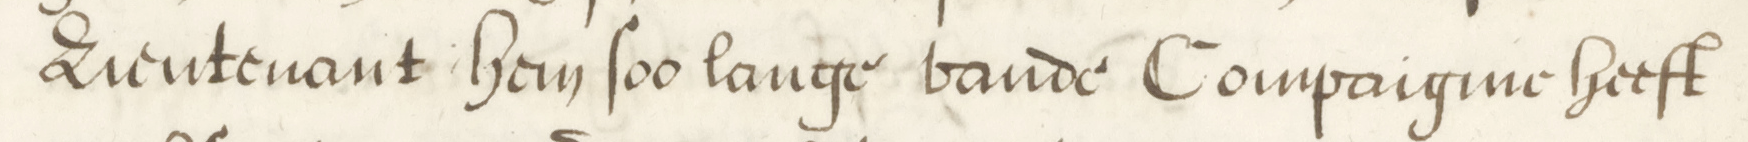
Lieutenant hem soo lange vande Compaignie heeft
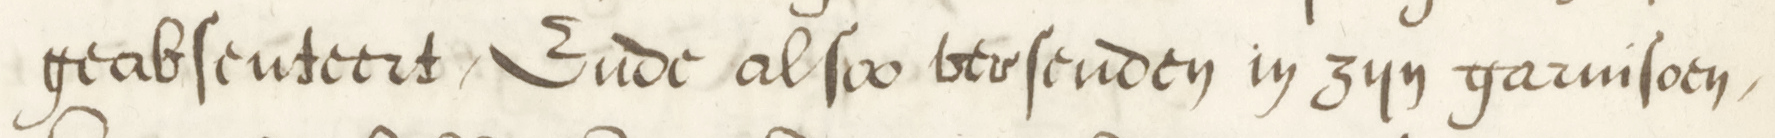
geabsenteert. Ende als versenden in zyn garnisoen,
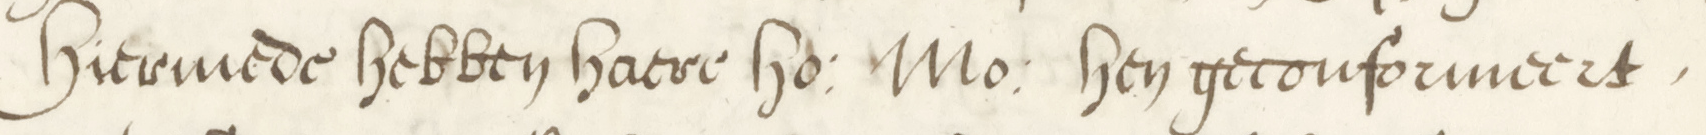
hiermede hebben haere Ho:Mo: hen geconformeert,
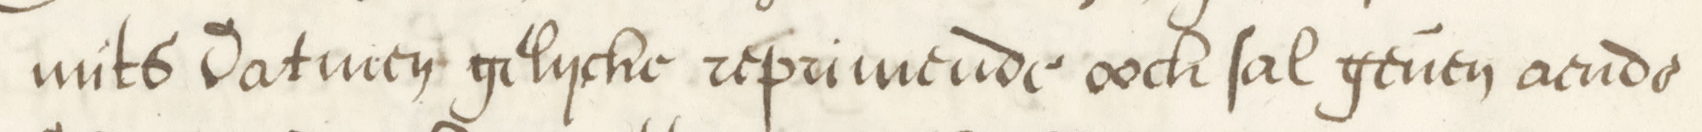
mits datmen gelycke reprimende oock sal geuen aende
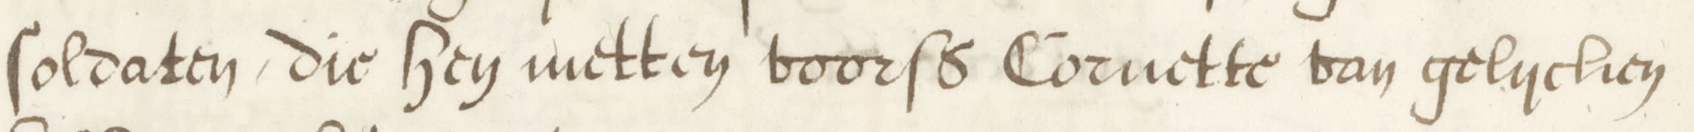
soldaten, die hen metten voors Cornette van gelycken
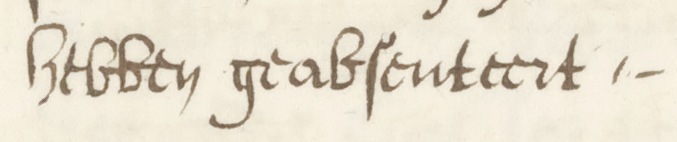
hebben geabsenteert.
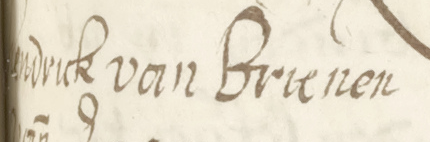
Hendrick van Brienen
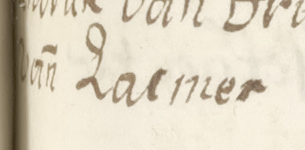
van Lacmer
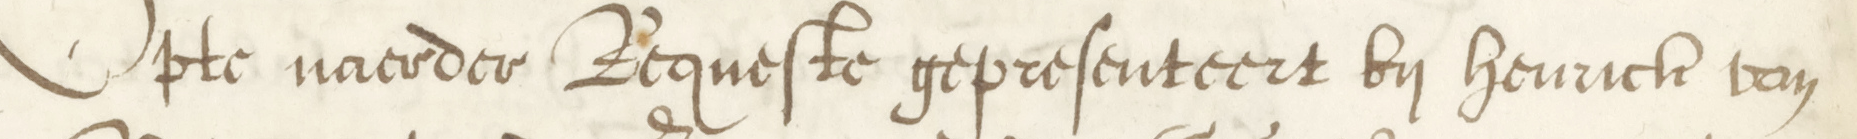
Opte naerder Requeste gepresenteert by henrick van
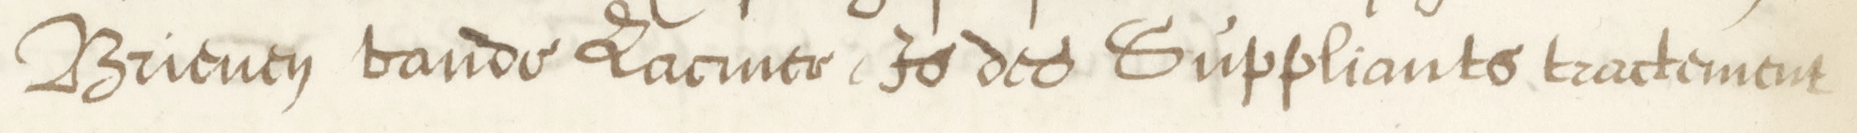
Brienen vande Lacmer, Is des Suppliants tractement
